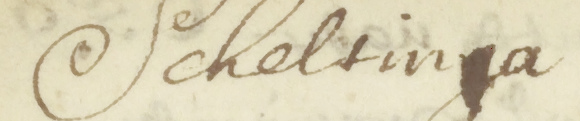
Scheltinga
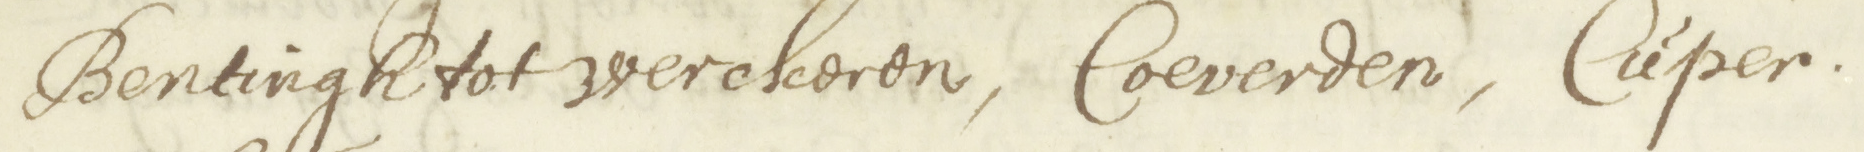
Bentingh tot werckeren, Coeverden, Cuper
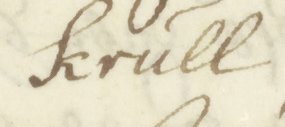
krull,
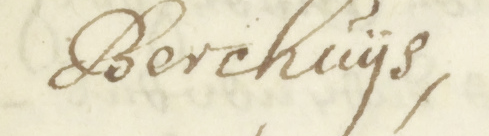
Berchuijs,
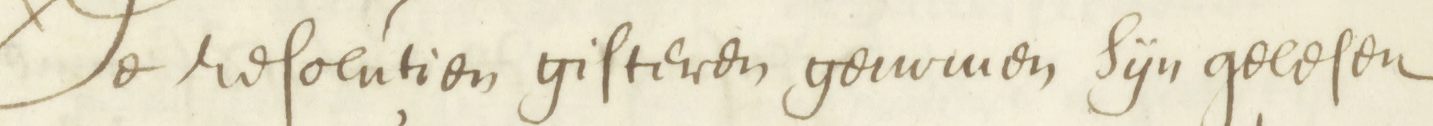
De resolutien gisteren genomen sijn gelesen
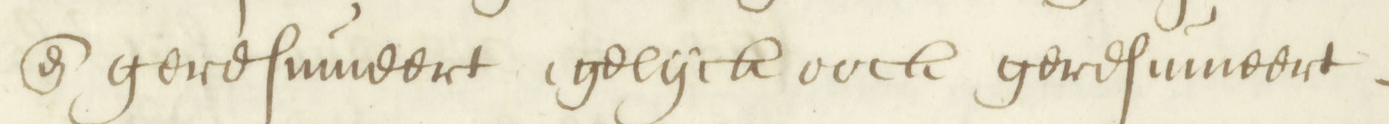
& geresumeert, gelijck oock geresumeert -
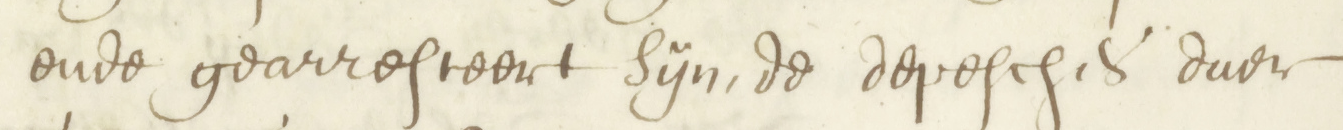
ende gearresteert sijn, de depesches daer
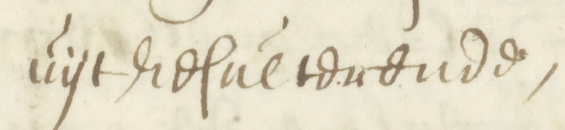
uijt resulterende.
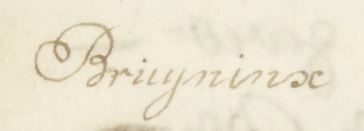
Bruyninx
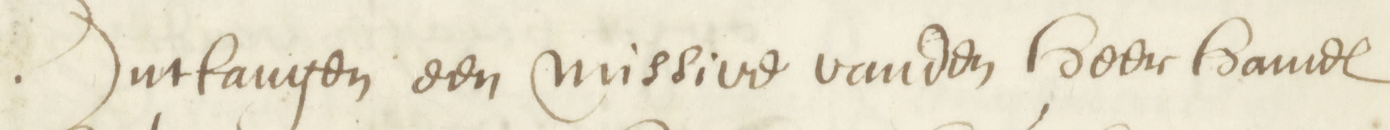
Ontfangen een missive vanden heer hamel
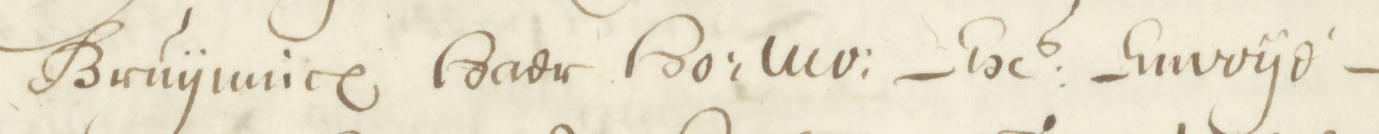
Bruijnincx haer ho:mo: Exs. Envoijé -
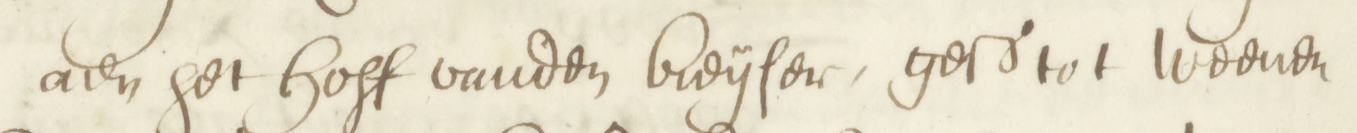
aen het hoff vanden keijser, gess. tot Weenen -
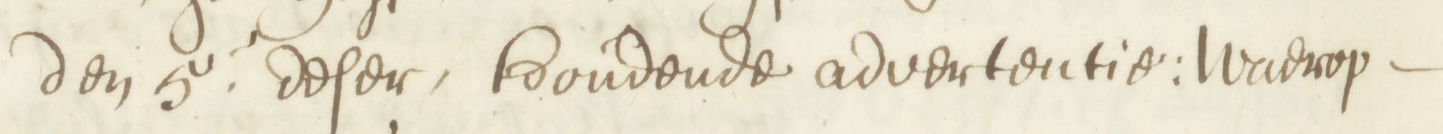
den 5e. deser, houdende advertentie: Waerop -
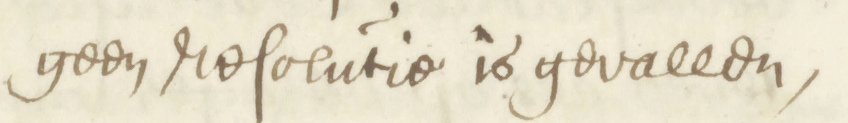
geen resolutie is gevallen.
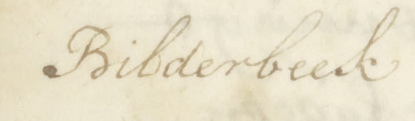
Bilderbeek
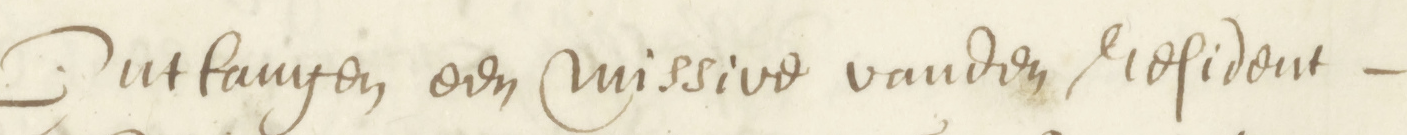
Ontfangen een missive vanden resident -
